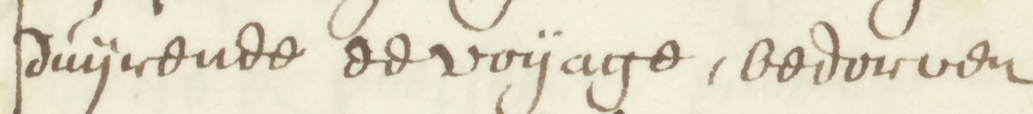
duijrende de voijage, bedorven
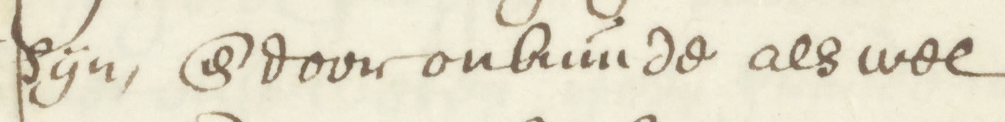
sijn, & door onkunde als wel
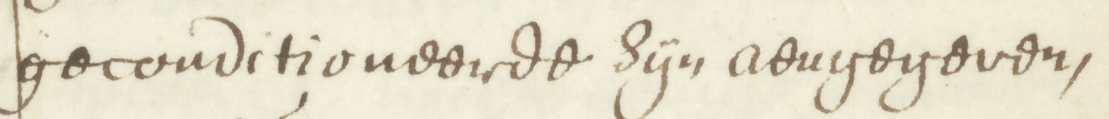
geconditioneeerde sijn aengegeven,
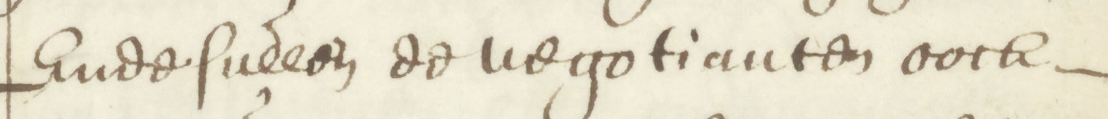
Ende sullen de negotianten oock —
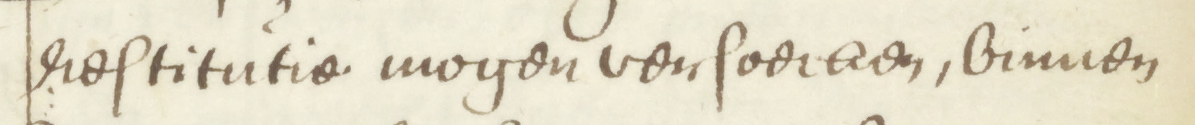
restitutie mogen versoecken, binnen
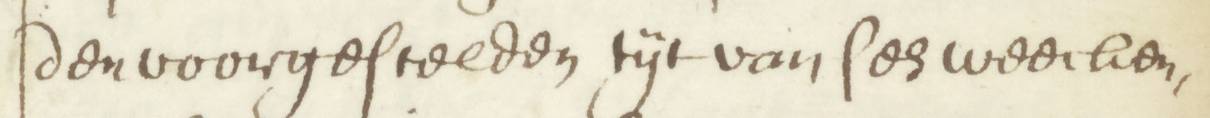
den voorgestelden tijt van ses weecken,
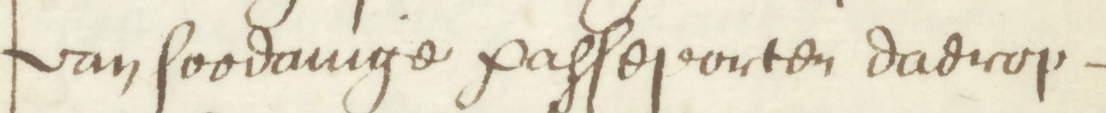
van soodanige passeporten daerop —
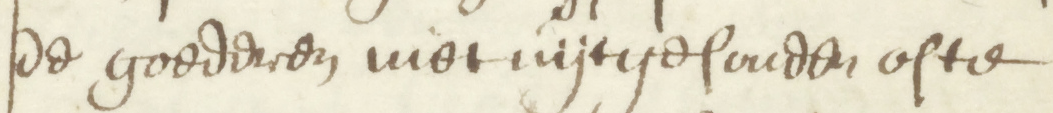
de goederen niet uijtgesonden, ofte
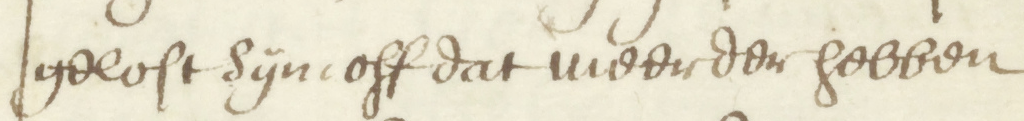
gelost sijn, off dat meerder hebben
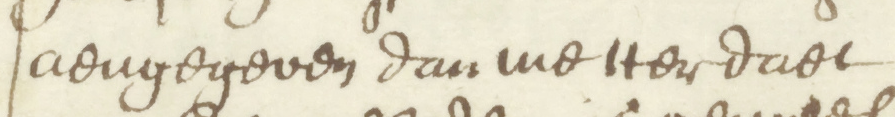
aengegeven dan metterdaet —
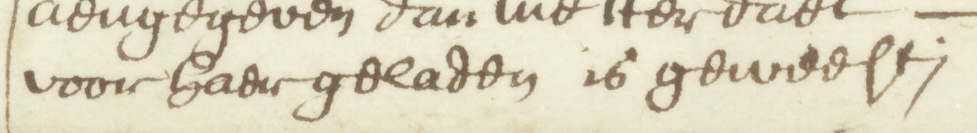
voor haer geladen is geweest.
